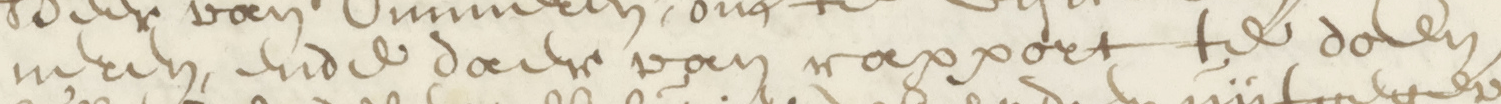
neren, ende daer van rapport te doen,
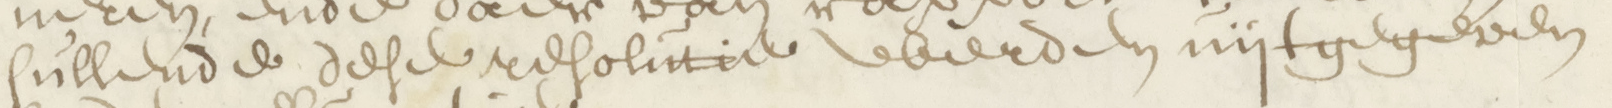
sullende dese resolutie werden uijtgegeven
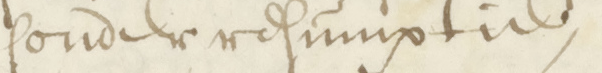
sonder resumptie.
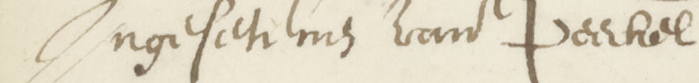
Ingesetenen van Peeckel
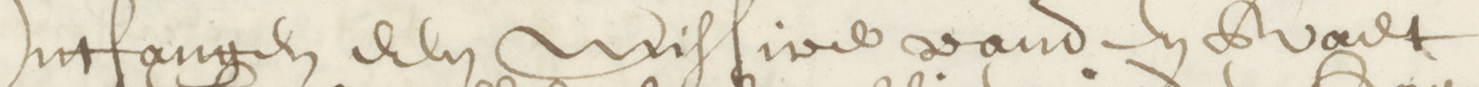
Ontfangen een missive vanden Raet
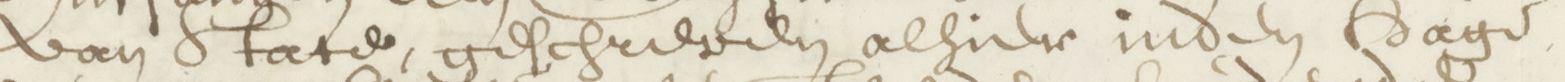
van State, geschreven alhier inden Hage
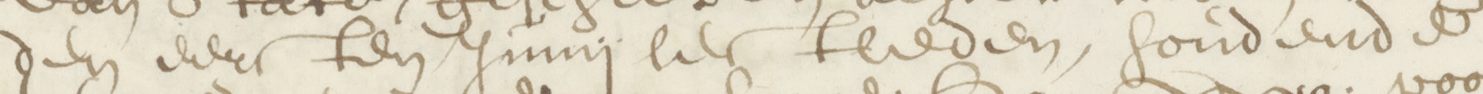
den eersten Junij lestleden, houdende
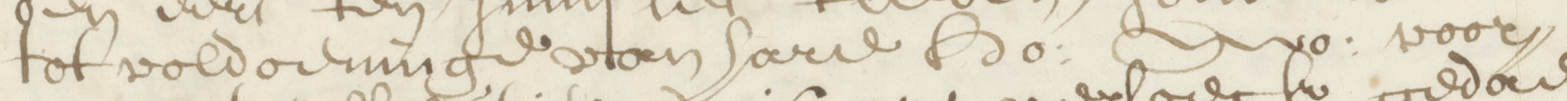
tot voldoeninge van hare Ho:Mo: voor,,
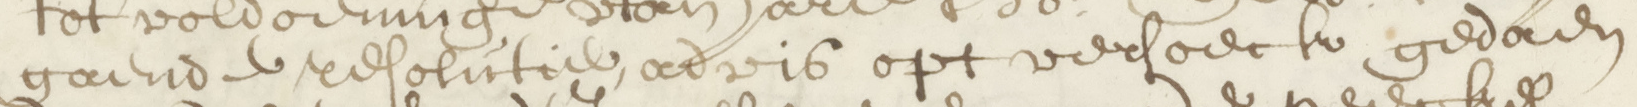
gaende resolutie, advis opt versoeck gedaen
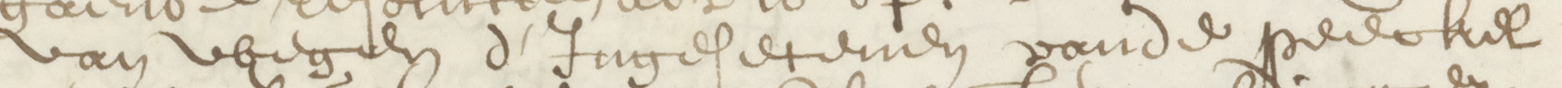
van wegen d' Ingesetenen vande peeckel
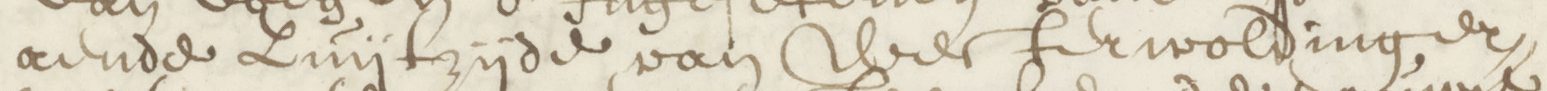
aende Zuijtzijde van Westerwoldinger,,
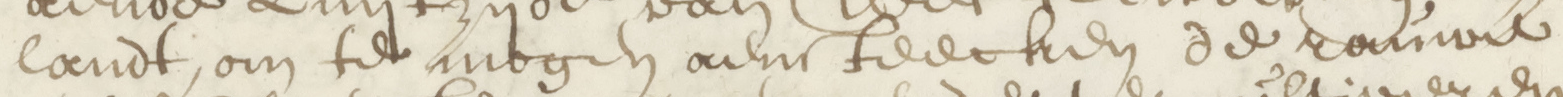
landt, om te mogen aensteecken de rauwe
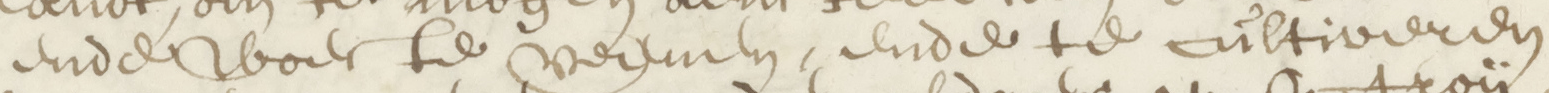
ende woeste veenen, ende te cultiveren
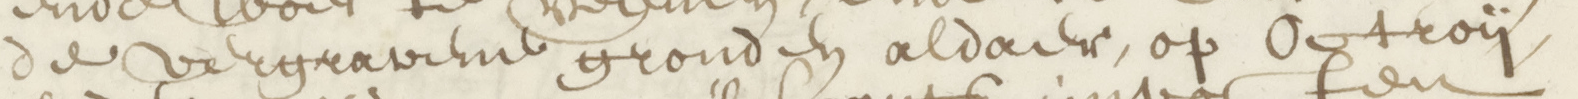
de vergravene gronden aldaer, op Octroij,
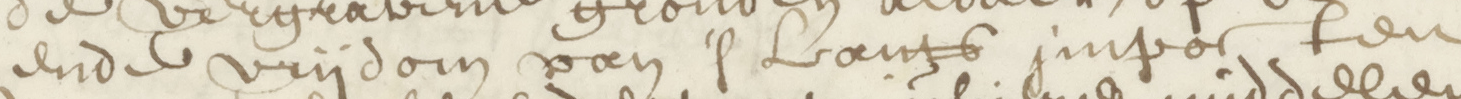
ende vrijdom van 's Lants imposten
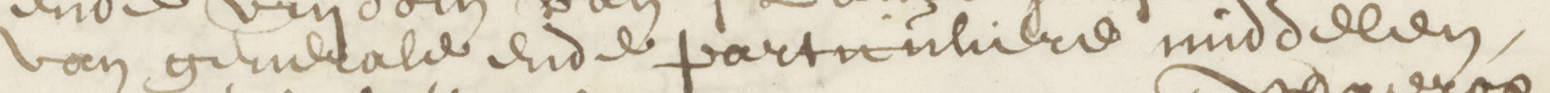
van generale ende particuliere middelen,
